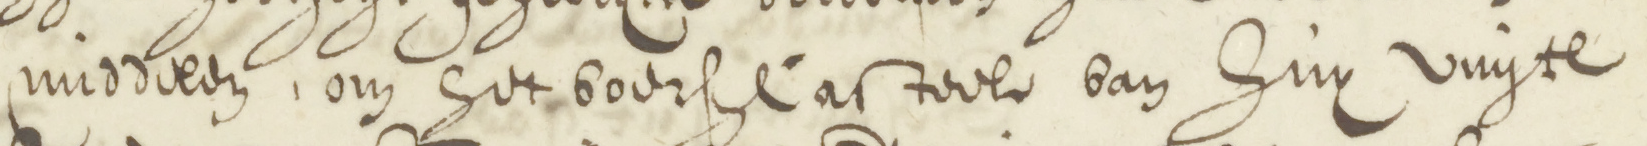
middelen, om het voers Casteel van Huy vuijte
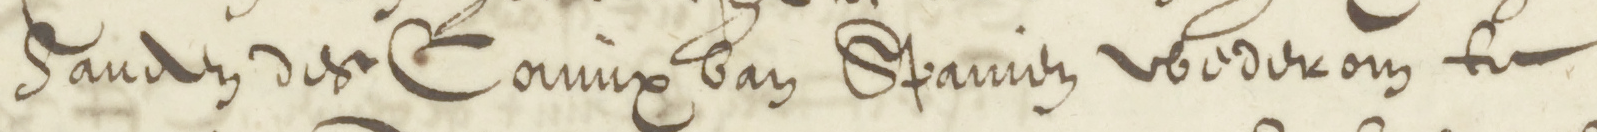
handen des Coninx van Spanien wederom te
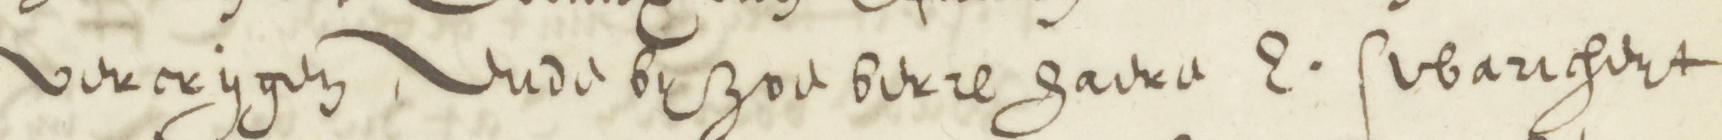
vercrijgen. Ende byzoe verre haere E. swaricheyt
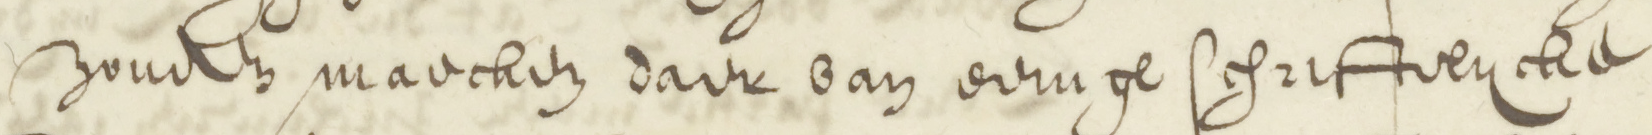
zouden maecken daer van eenige schriftelycke
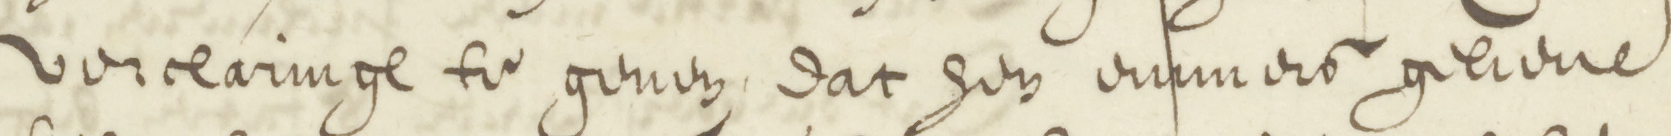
verclaringe te geuen, dat hen emmers gelieue
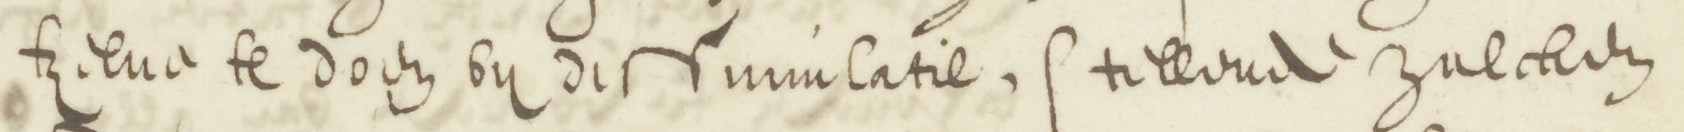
tzelue te doen by dissimulatie, stellende zulcken
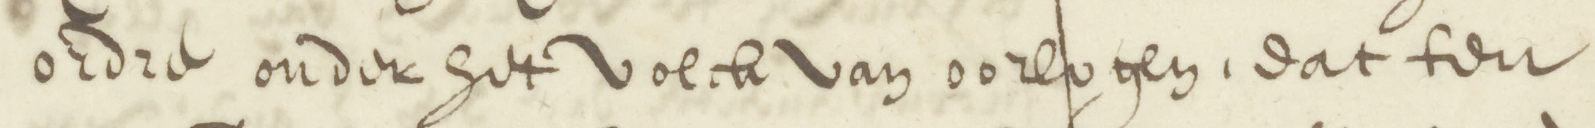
ordre onder het volck van oorlogen, dat ten
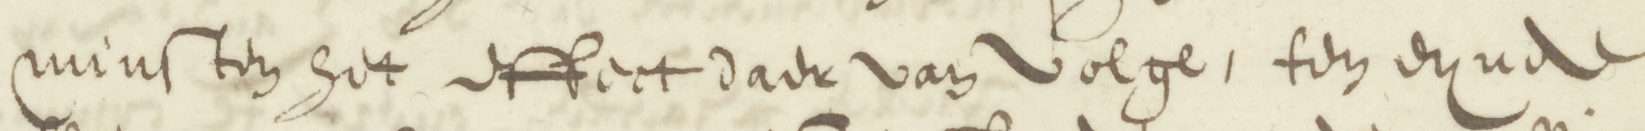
minsten het effect daer van volge, ten eynde
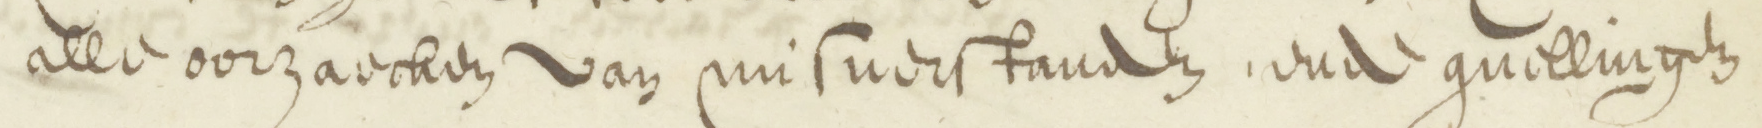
alle oorzaecken van misuerstanden, ende quellingen
